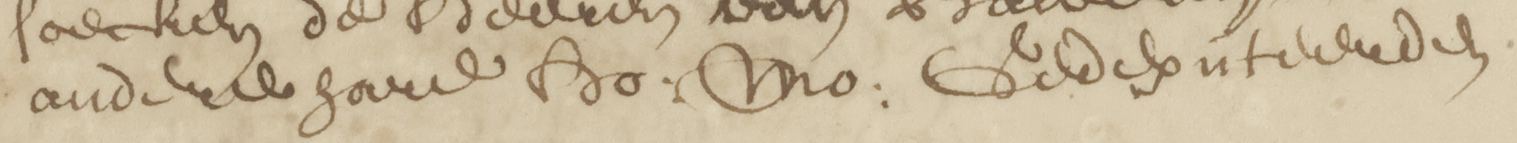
andere hare Ho:Mo: Gedeputeerden
